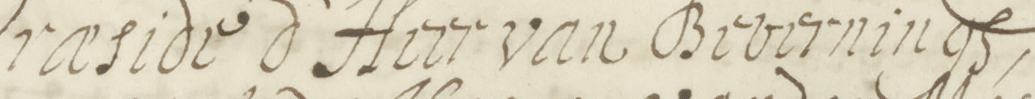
Præside d'Heer van Beverninge
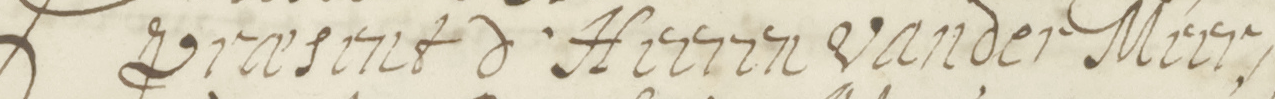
Præsent d'Heeren vander Meer,
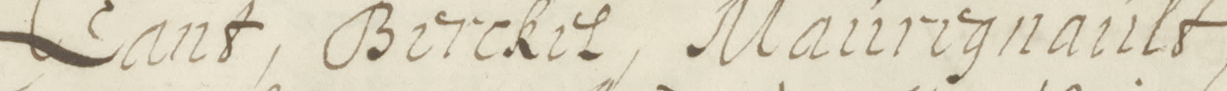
Cant, Berckel, Mauregnault
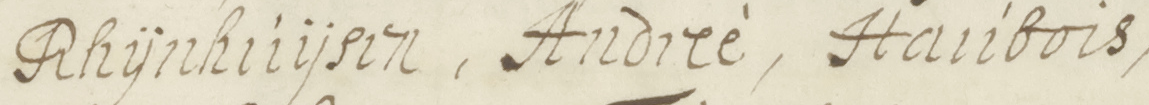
Rhijnhuijsen, Andree, Haubois,
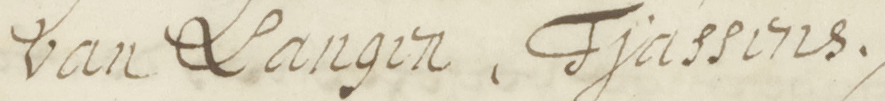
van Langen, Tjassens.
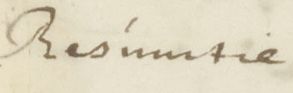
Resumtie
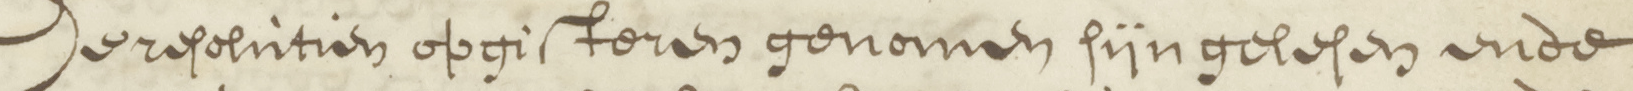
De resolutien opgisteren genomen sijn gelesen ende
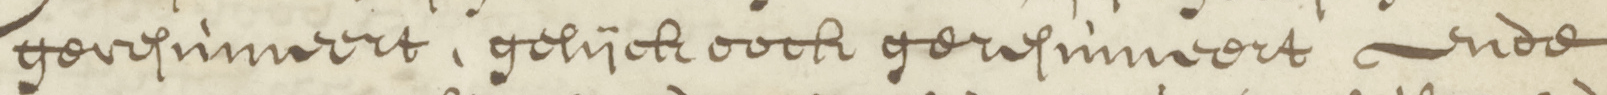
geresumeert, gelijck oock geresumeert ende
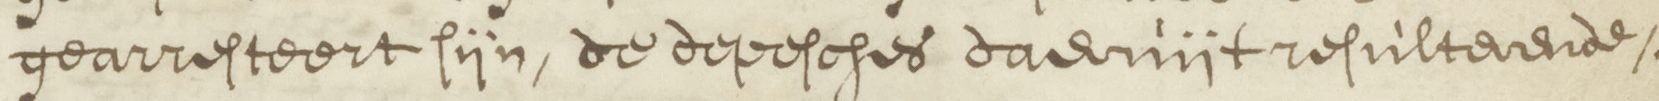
gearresteert sijn, de depesches daeruijt resulterende.
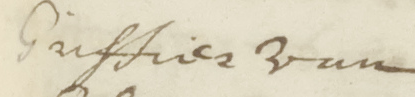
Griffier van
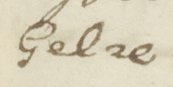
Gelre
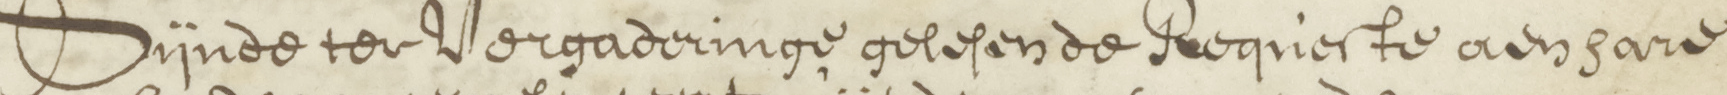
Sijnde ter Vergaderinge gelesen de Requeste aen hare
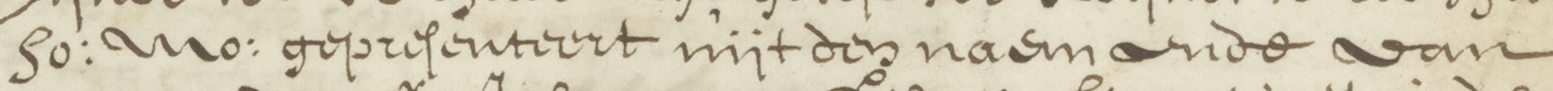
ho:Mo: gepresenteert uijt den naem ende van
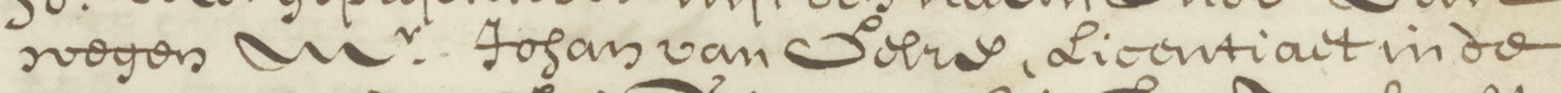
wegen Mr. Johan van Gelre, Licentiaet in de
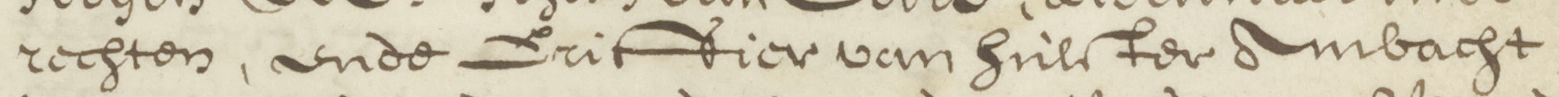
rechten, ende Griffier van Hulster Ambacht
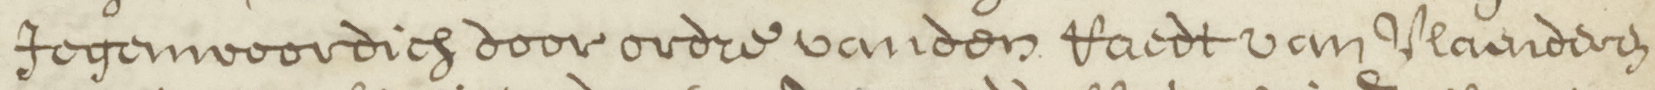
Jegenwoordich door ordre vanden Raedt van Vlaenderen
